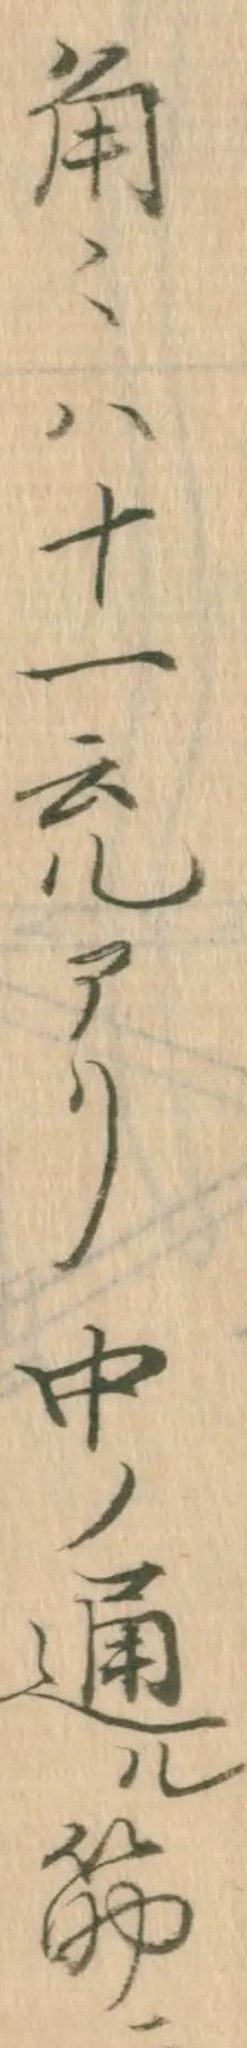角々ハ十一充アリ中ノ通ル筋ニ
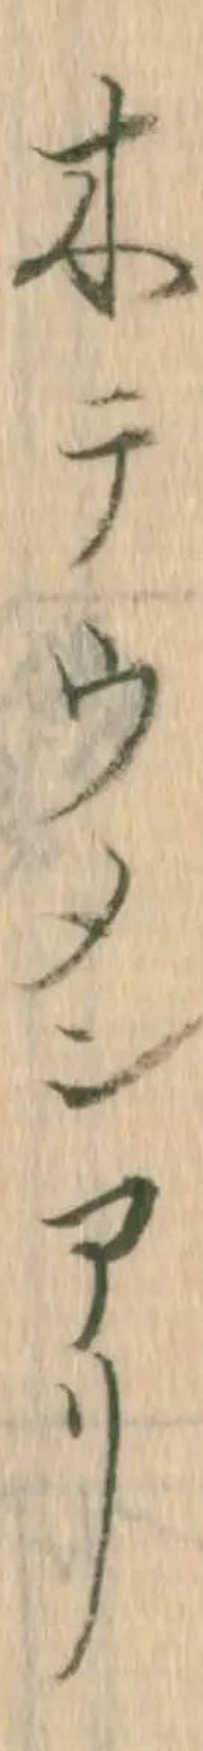木テウメンアリ
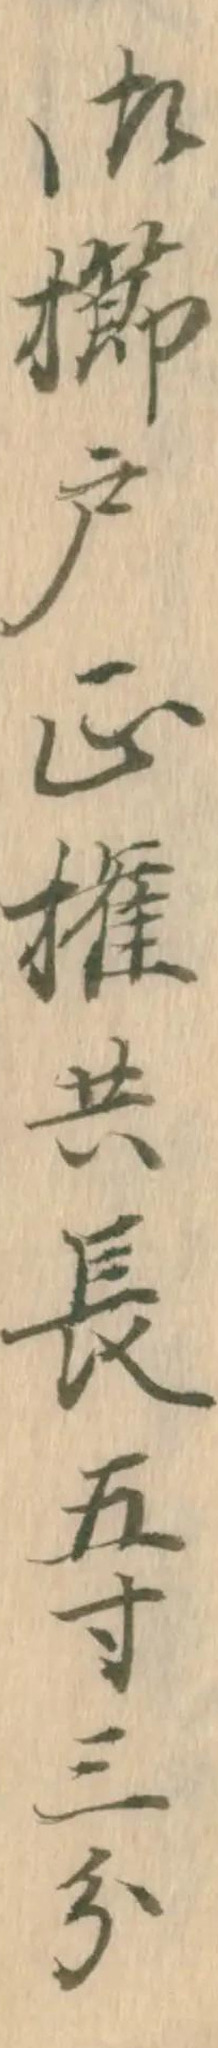御櫛戸正権共長五寸三分
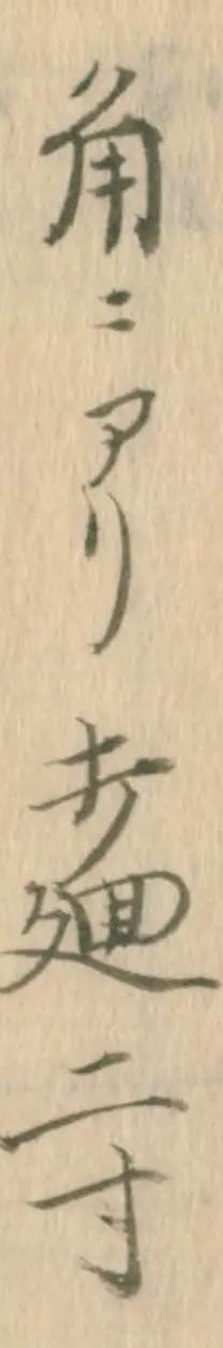角ニアリ打廻二寸
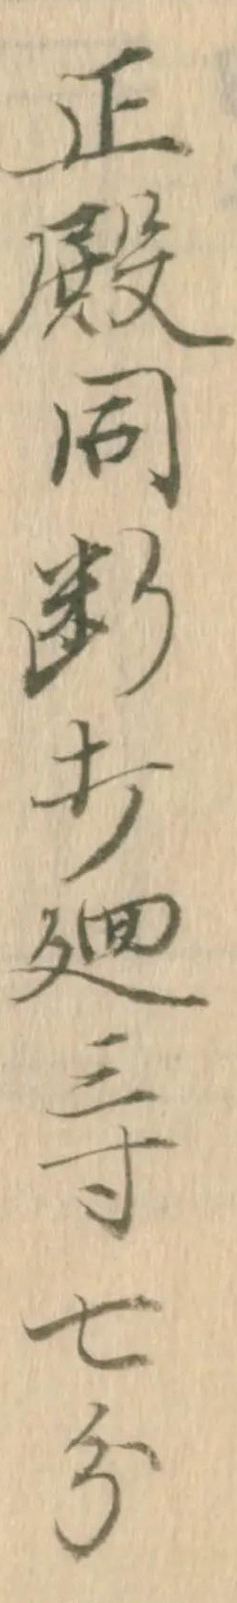正殿同断打廻三寸七分
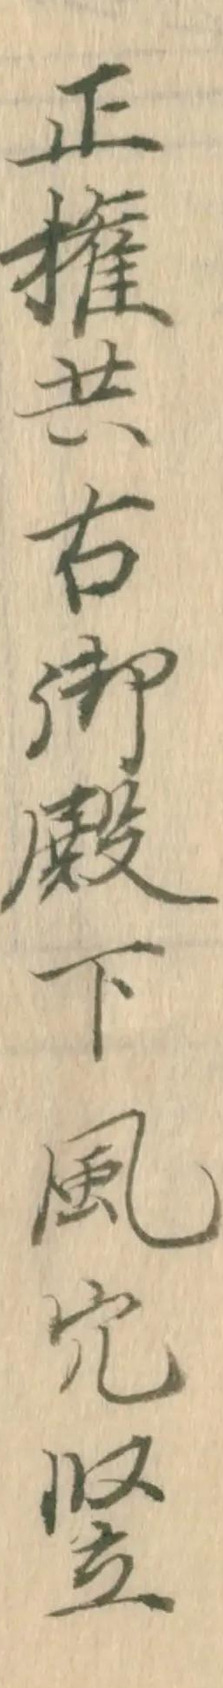正権共右御殿下風穴竪
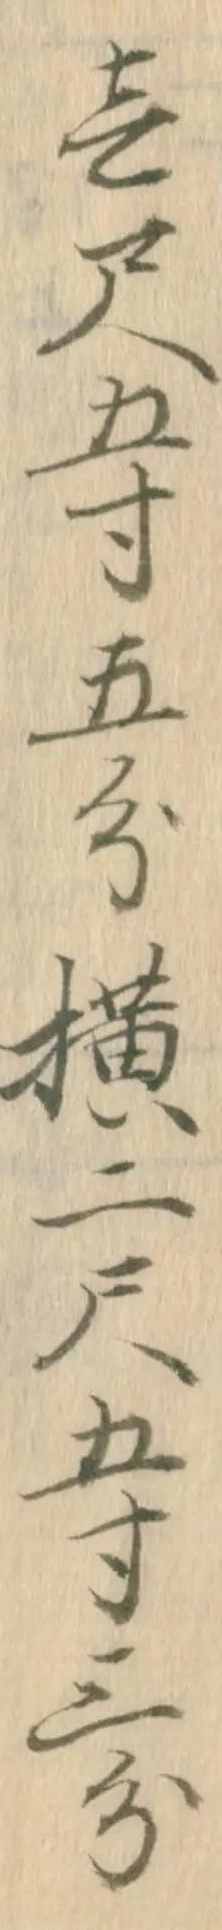壱尺五寸五分横二尺五寸三分
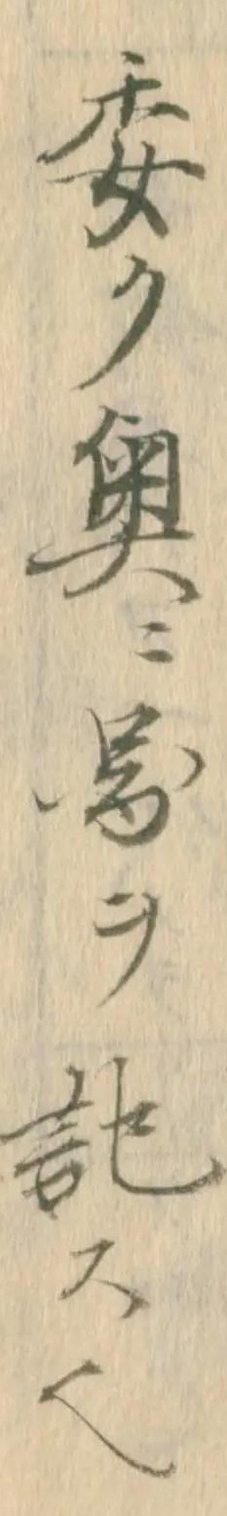委ク奥ニ図ヲ記ス也

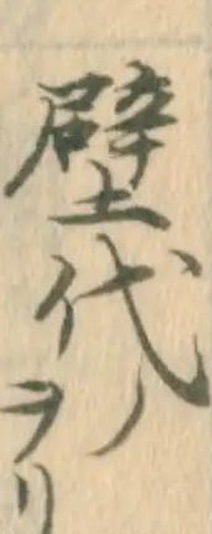壁代ノ
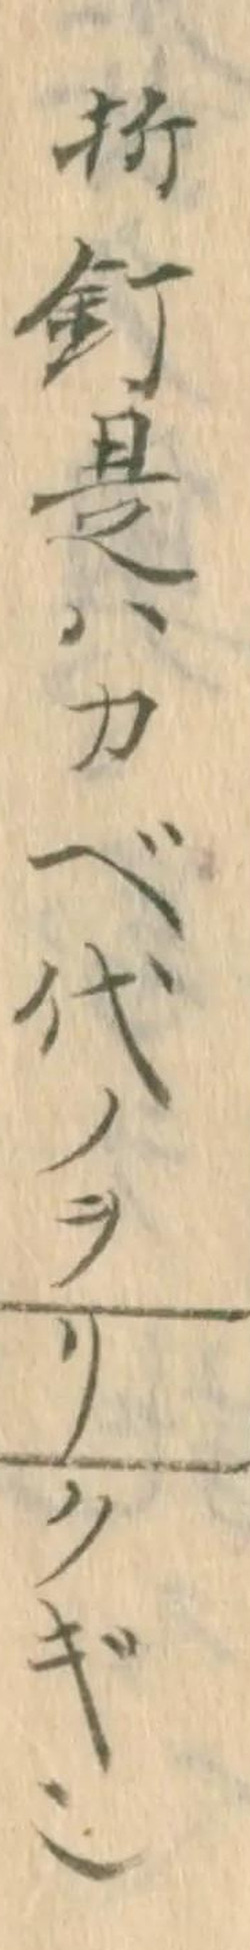折釘是ハカベ代ノヲリクギ也
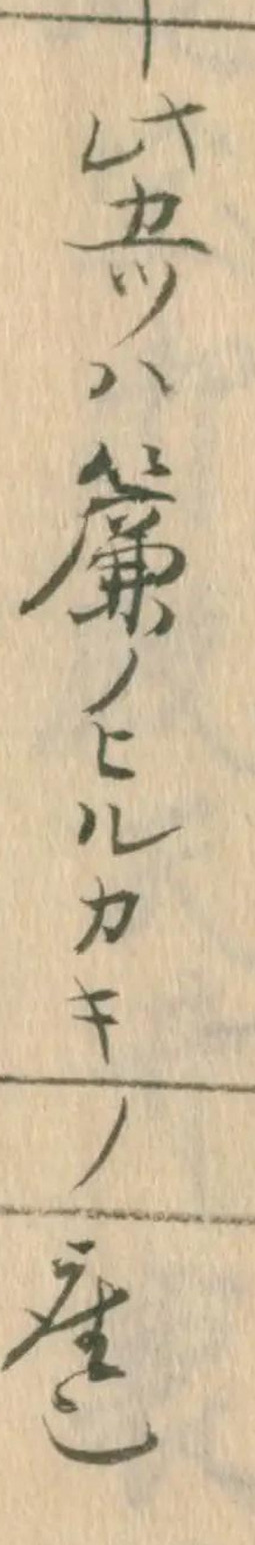後前此五ツハ簾ノヒルカキノ座也
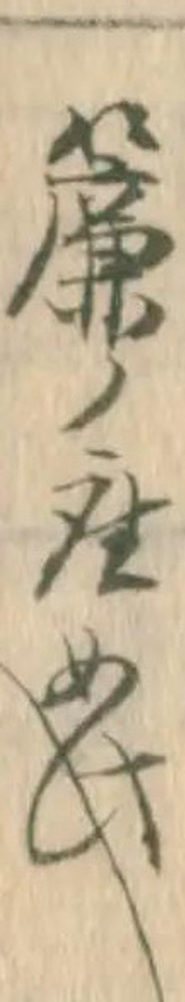簾ノ座如此
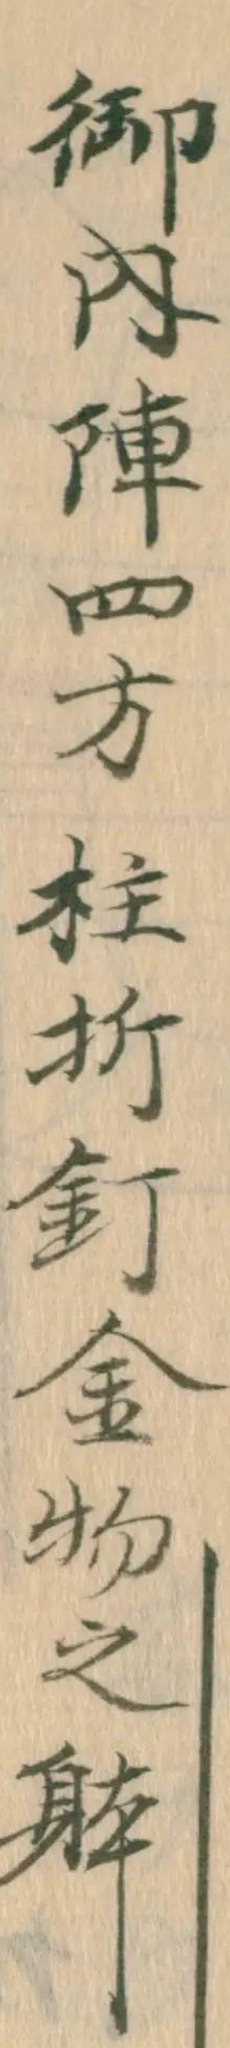御内陣四方柱折釘金物之体
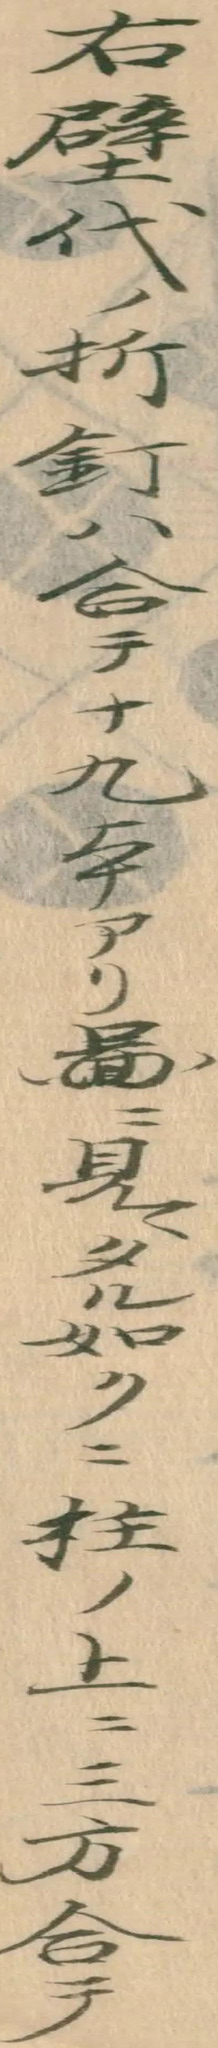右壁代ノ折釘ハ合テ十九本アリ図ニ見ヘタル如クニ柱ノ上ニ三方合テ
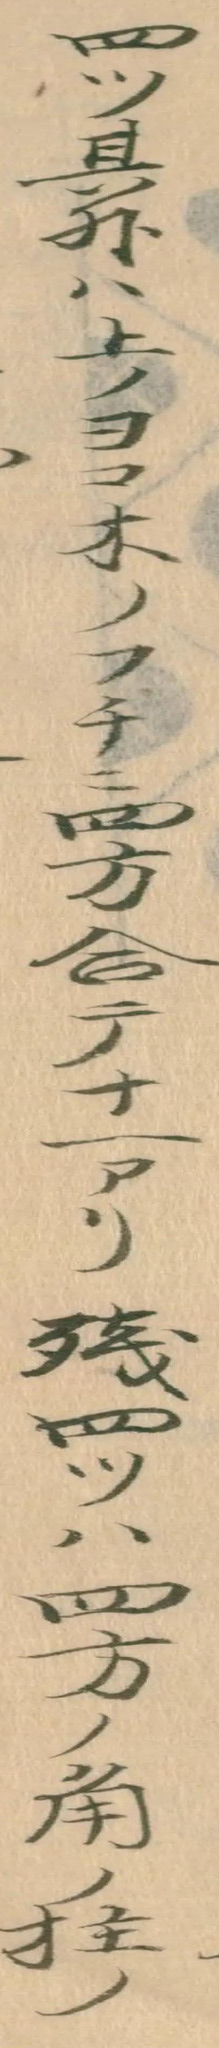四ツ其外ハ上ノヨコ木ノフチニ四方合テ十一アリ残四ツハ四方ノ角ノ柱ノ
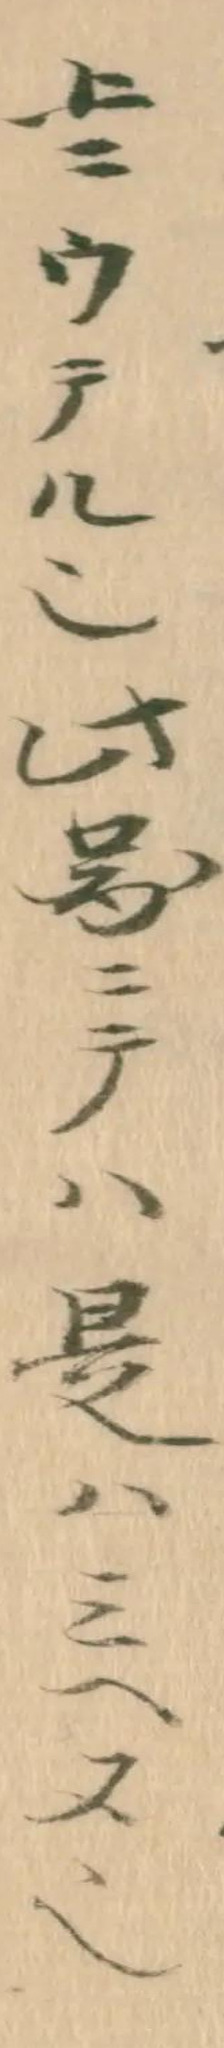上ニウテル也此図ニテハ是ハミヘス也
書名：賀茂社記録. 第15冊
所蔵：国立国会図書館 National Diet Library, JAPAN
